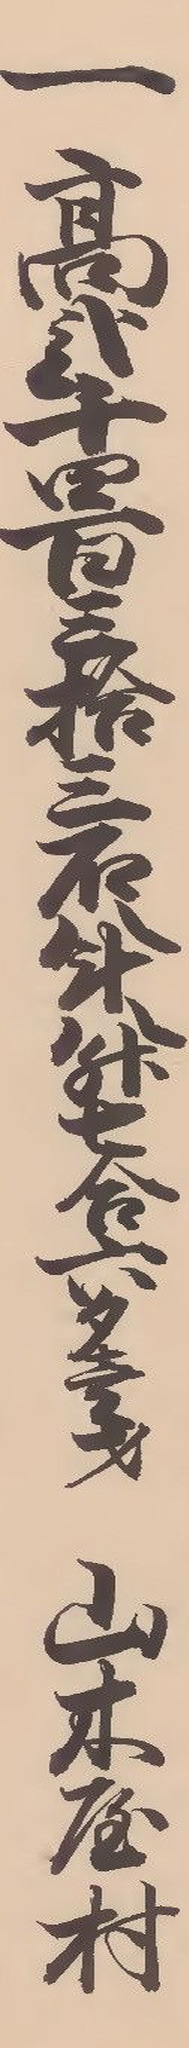一高弐千四百三拾三石八斗八升七合六勺壱才山木屋村
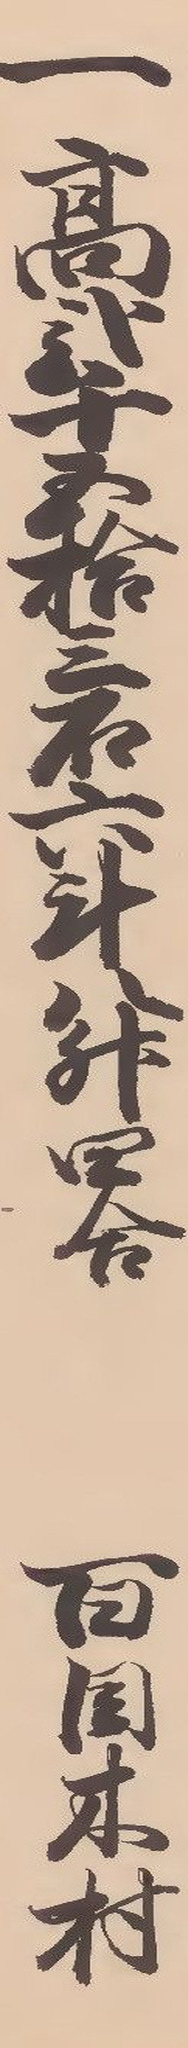一高弐千五拾三石六斗八升四合百目木村

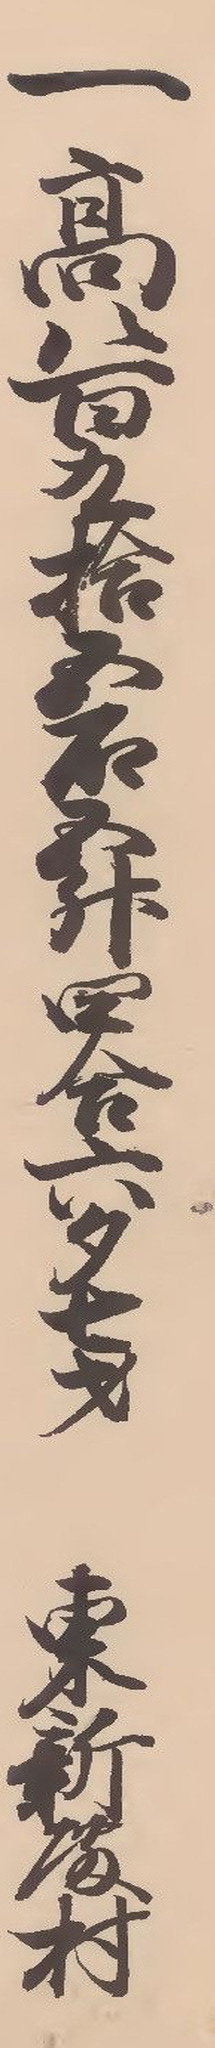一高八百九拾五石五升四合六勺七才東新殿村
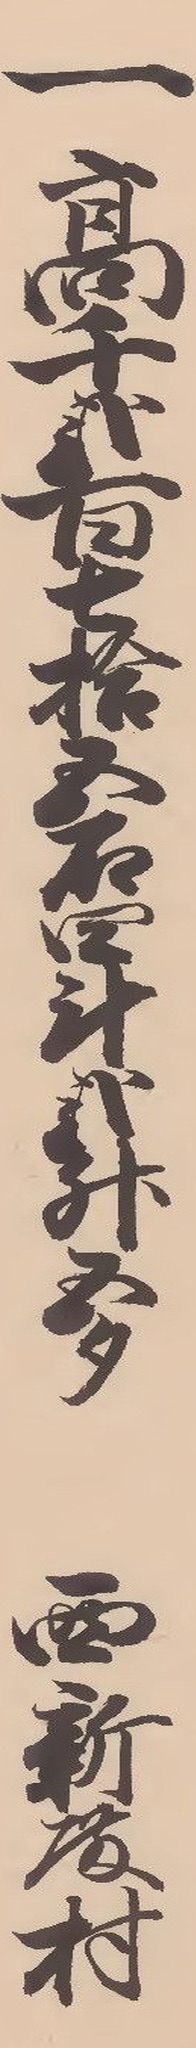一高千弐百七拾五石四斗弐五勺西新殿村
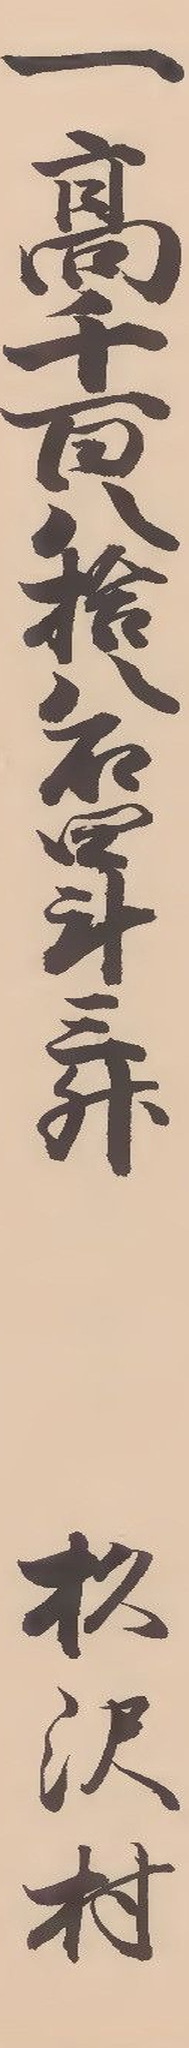一高千百八拾八石四斗三升杉沢村
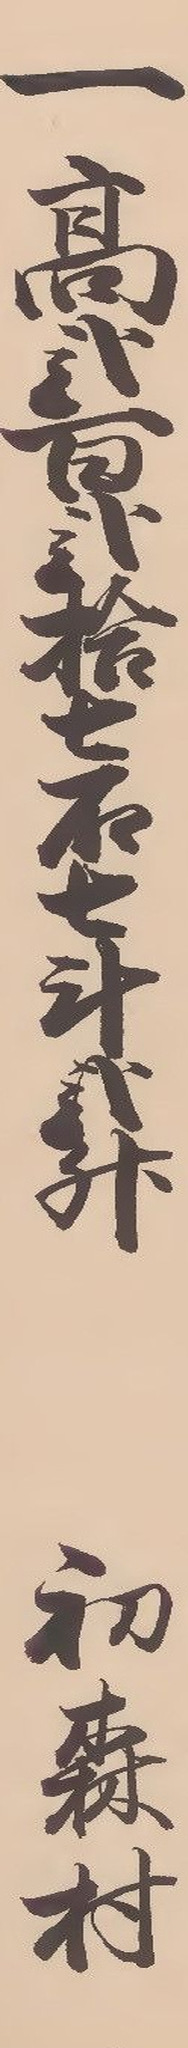一高弐百弐拾七石七斗弐升初森村
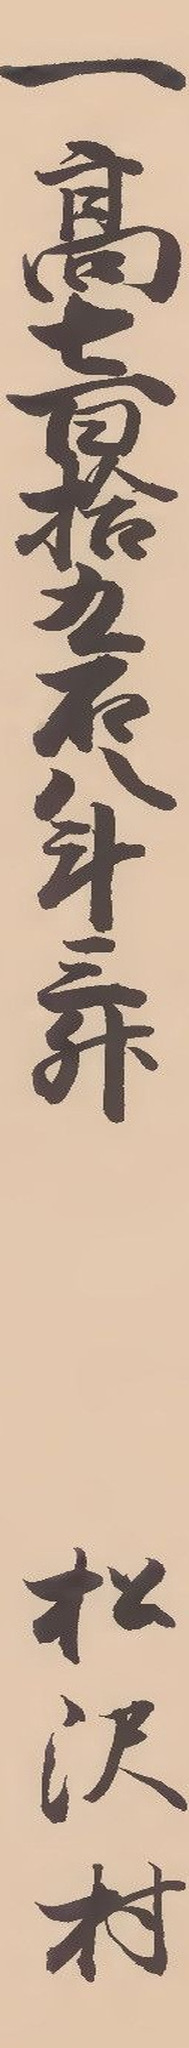一高七百拾九石八斗三升松沢村
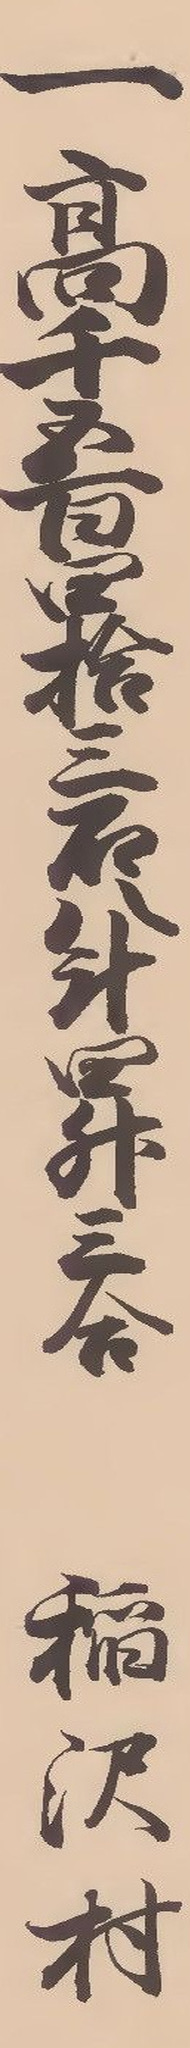一高千五百四拾三石八斗四升三合稲沢村
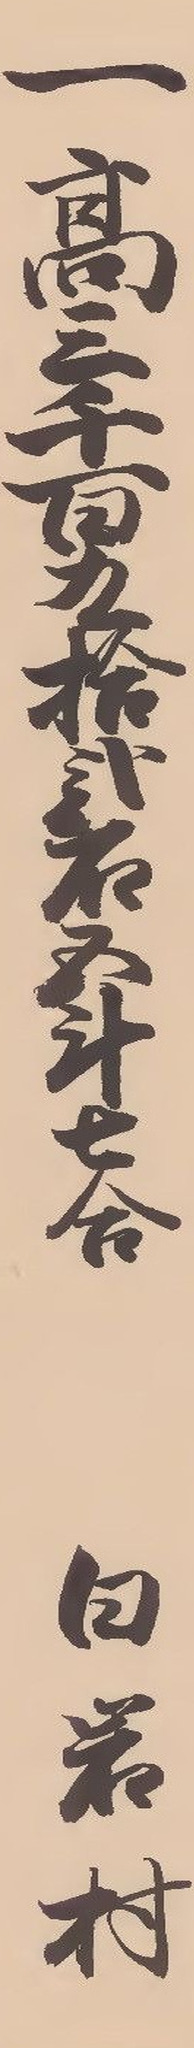一高三千百九拾弐石五斗七合白岩村
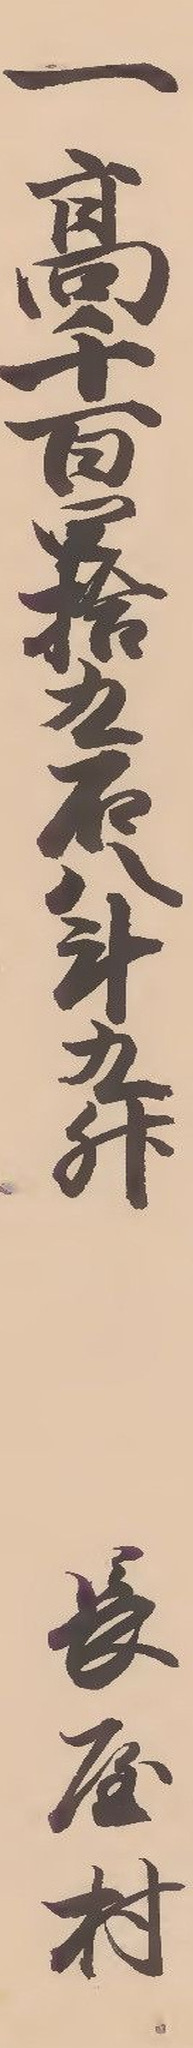一高千百四拾九石八斗九升長屋村

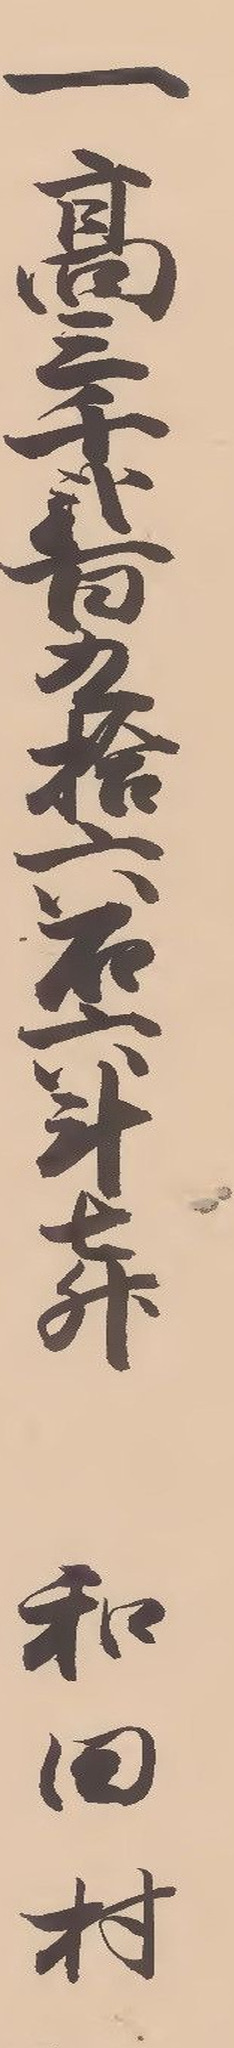一高三千弐百九拾六石六斗七升和田村
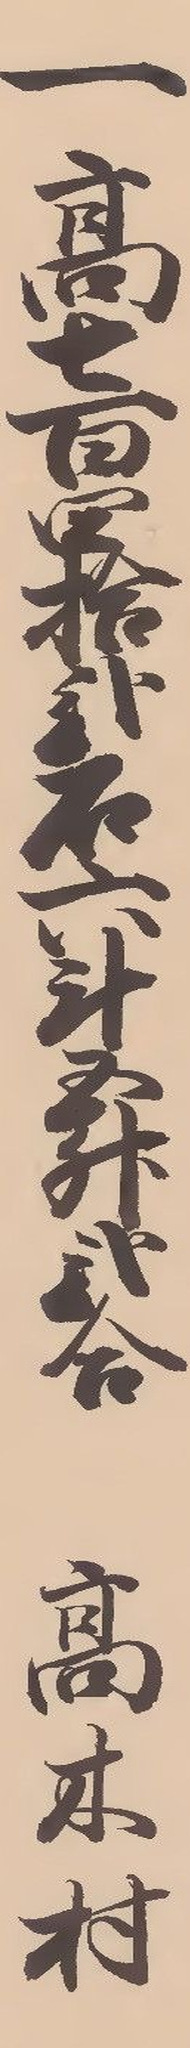一高七百四拾弐石六斗五升弐合高木村
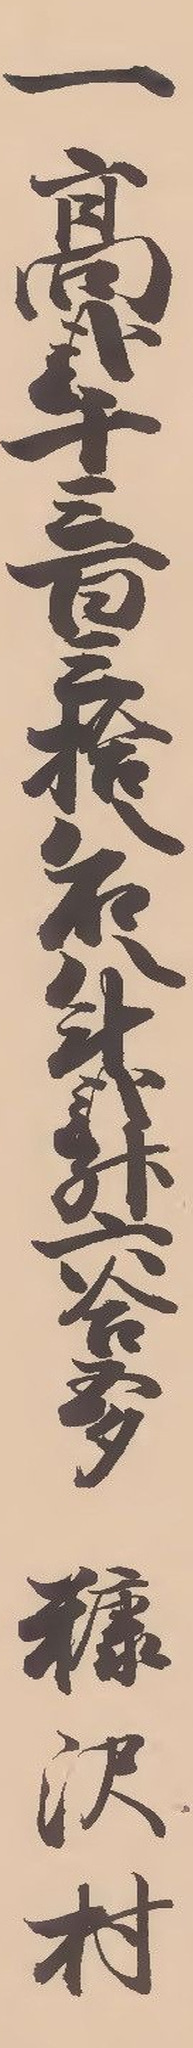一高弐千三百三拾八石八斗弐升六合五勺糠沢村
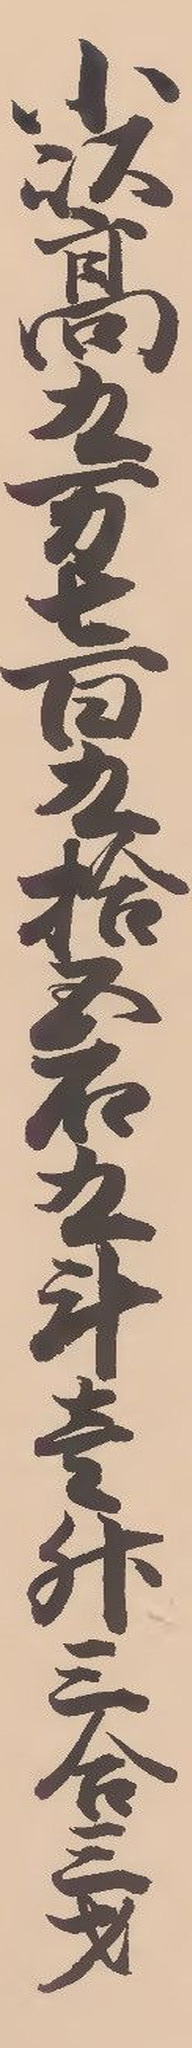小以高九万七百九拾五石九斗壱升三合三才

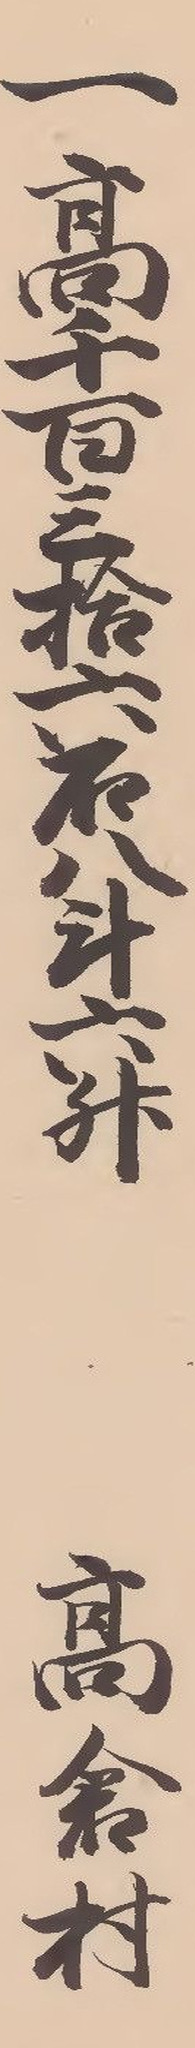一高千百三拾六石八斗六升高倉村
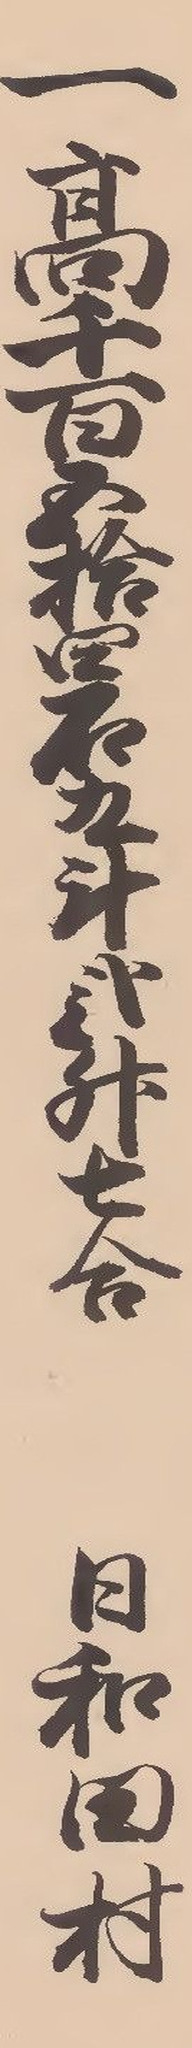一高千百五拾四石九斗弐升七合日和田村
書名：陸奥国郷帳　２
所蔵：国立公文書館 National Archives of Japan
